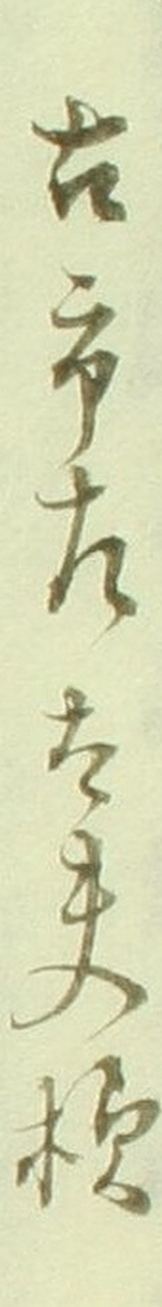古市左太夫様
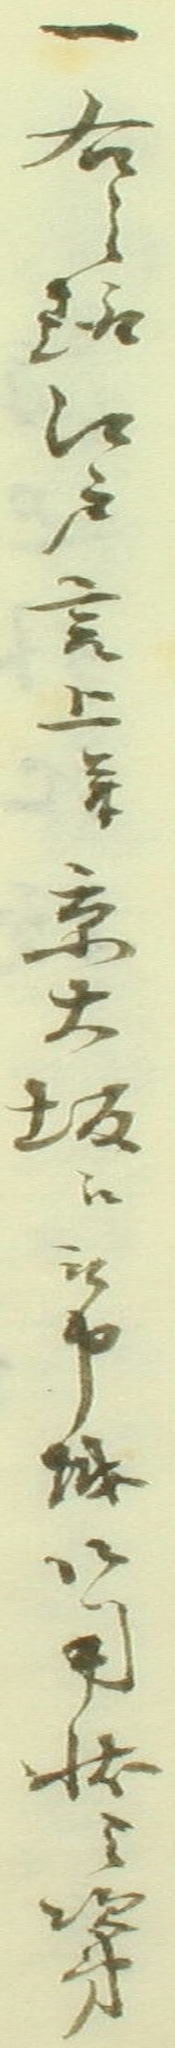一右之趣江戸言上并京大坂え被申越御用状之次第
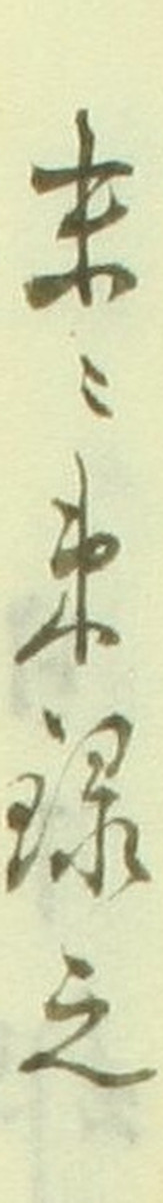末に束録之
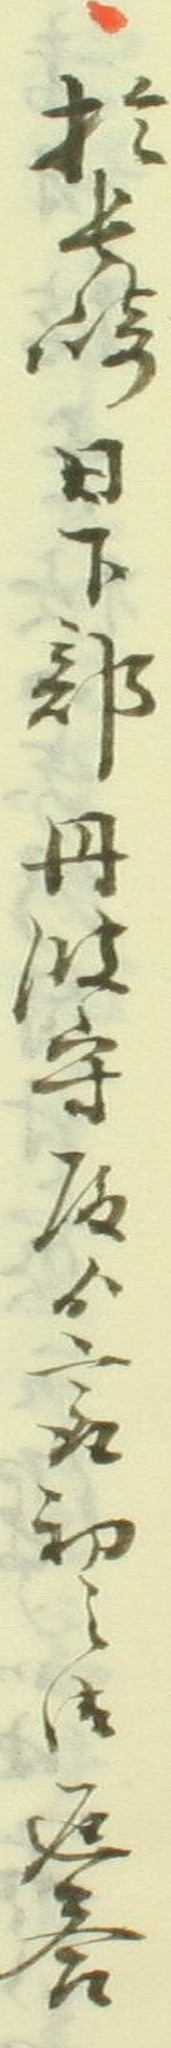於長崎日下部丹波守殿ゟ最初之御返答
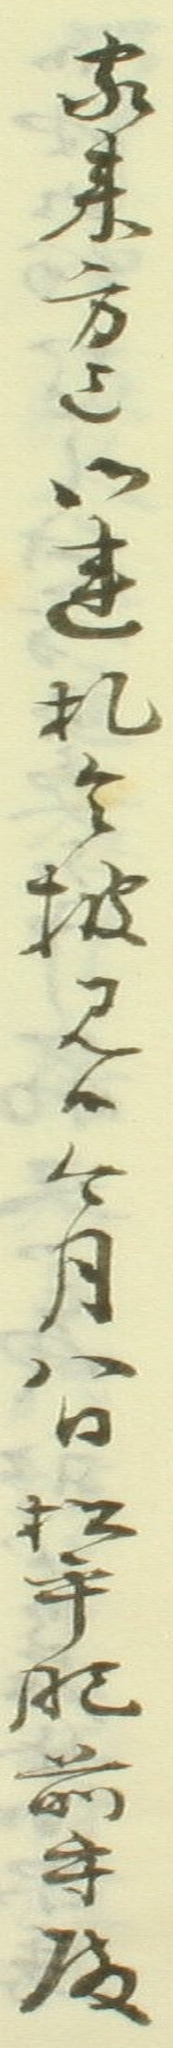家来方迄御連札令被見候今月八日松平肥前守殿
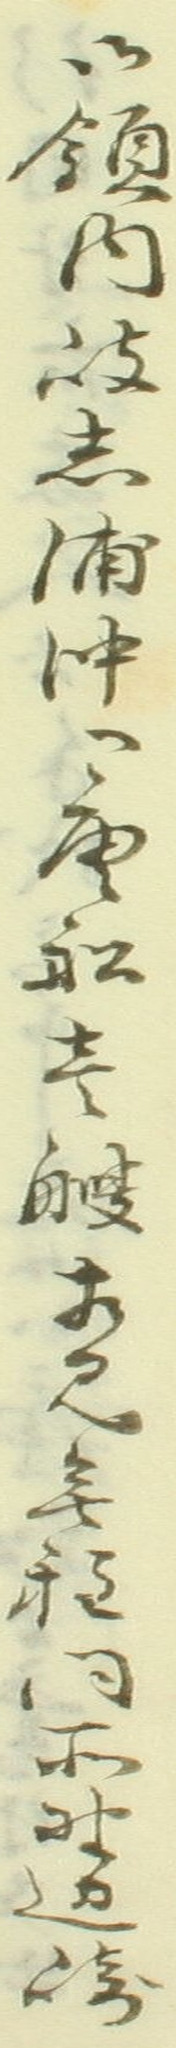御領内岐志浦沖へ唐船壱艘相見無程同所野辺崎
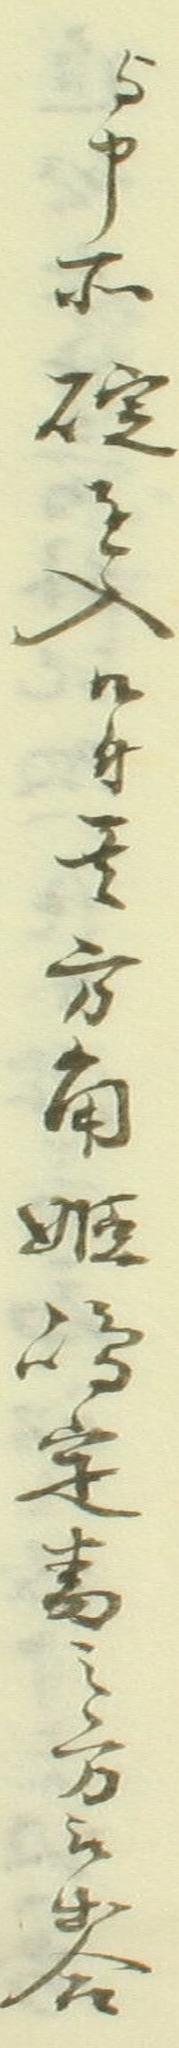与申所碇を入候付其方角姫島定番之方被出合
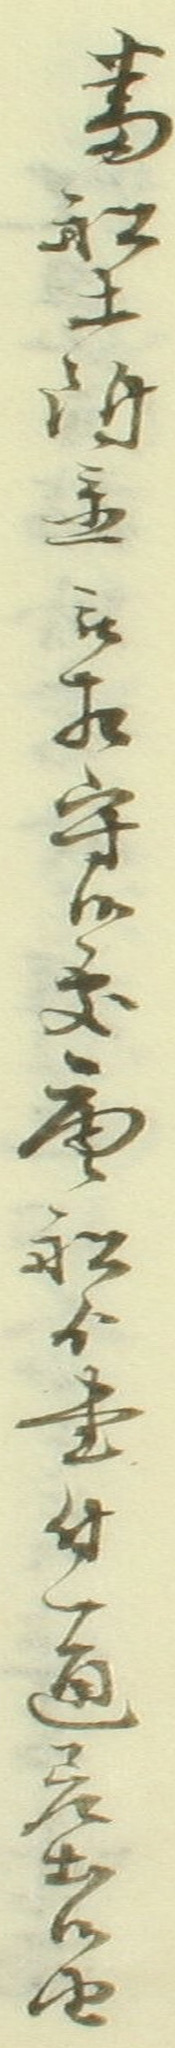番船等附置被相守候処唐船ゟ書付一通差出候由
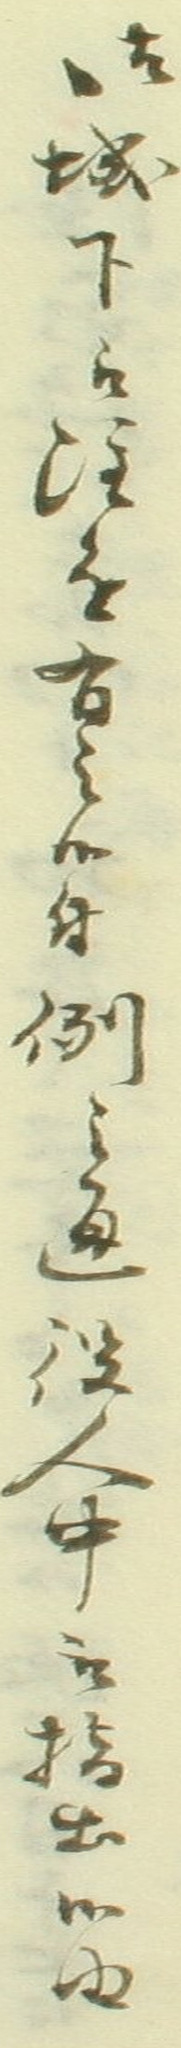御城下え注進有之候付例之通役人中被指出候由
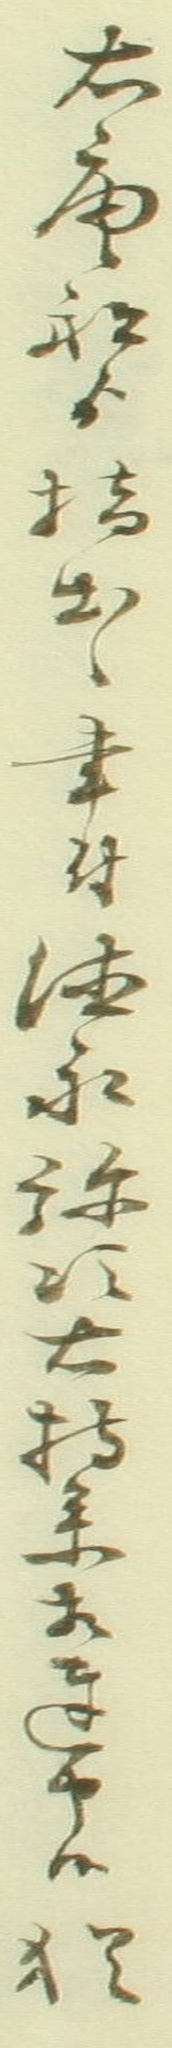右之唐船ゟ指出候書付徳永弥次右持参相達申候猶
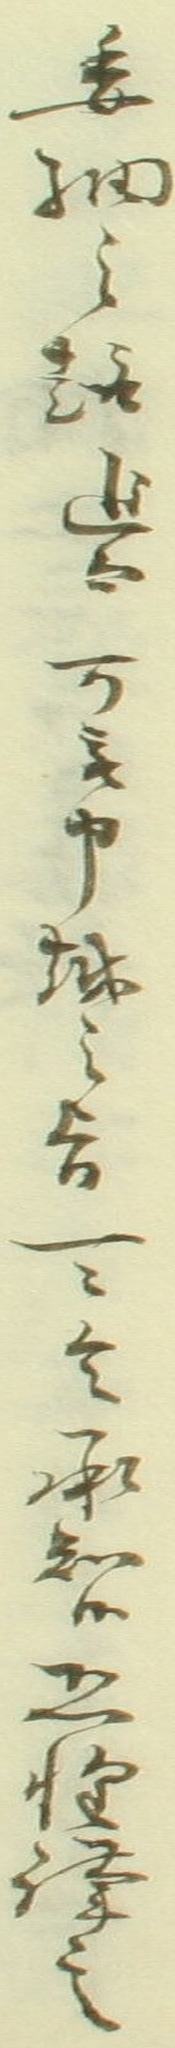委細之趣追而可被申越之旨可令承知候恐惶謹言
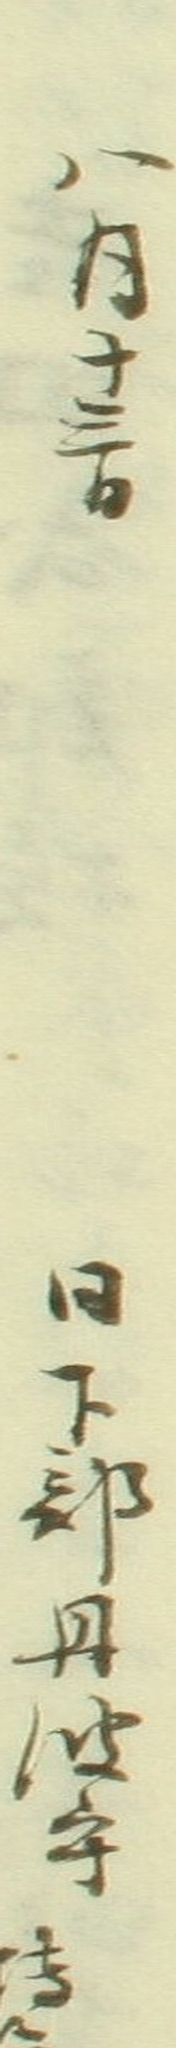八月十三日日下部丹波守博貞
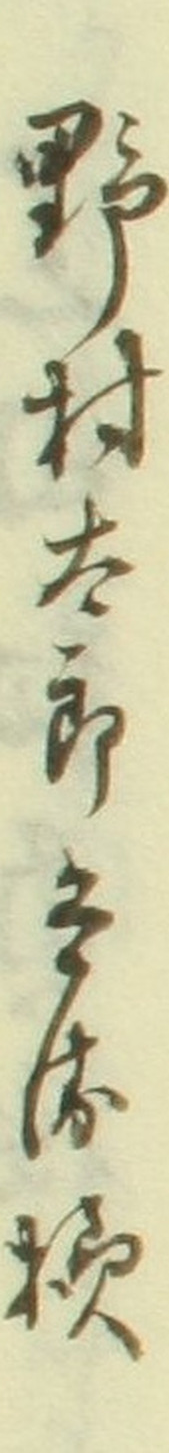野村太郎兵衛様

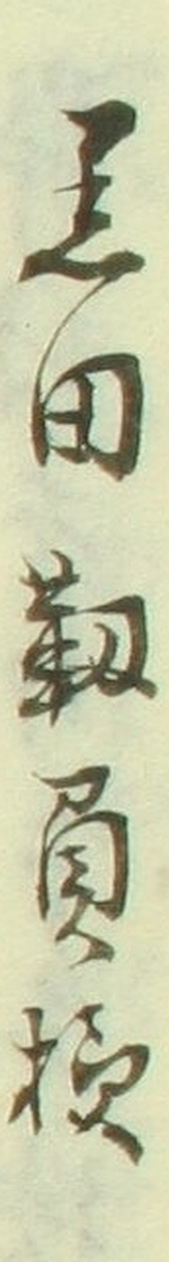黒田靭負様
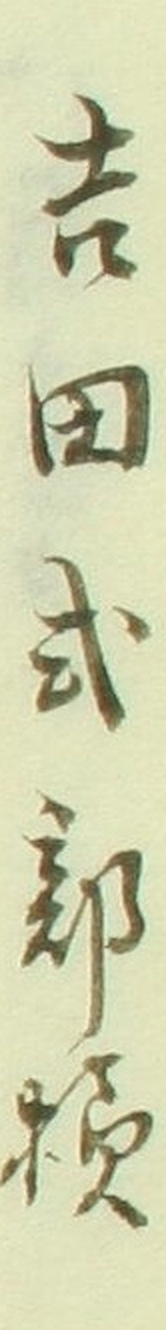吉田式部様
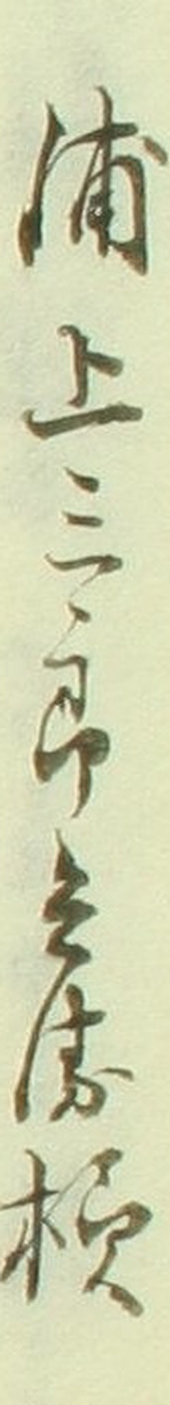浦上三郎兵衛様
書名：異国船漂着記
